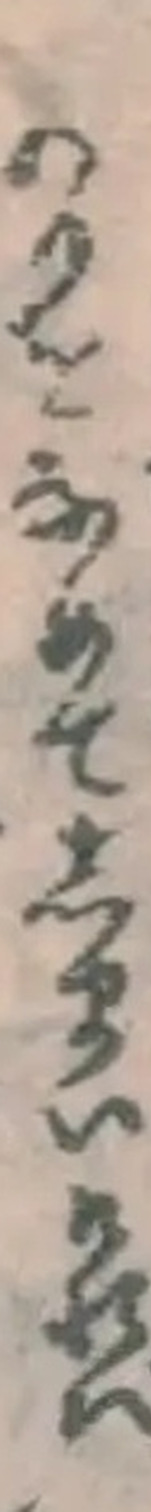のりをなめてしまいければ
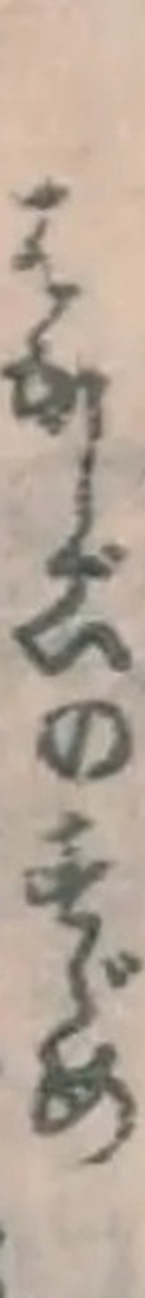はなしがいのすゞめ
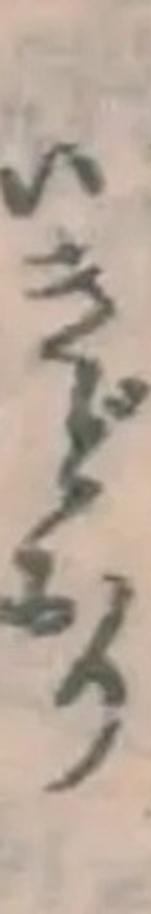いきどおり
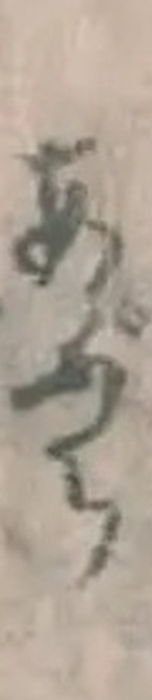あぶら
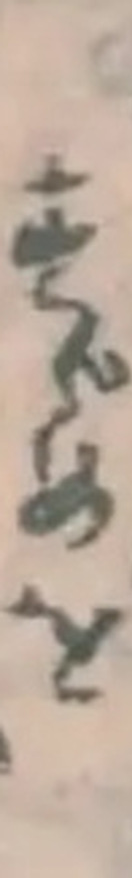すゞめを
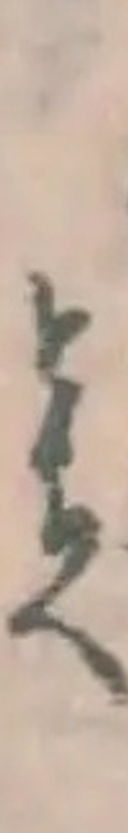とらへ
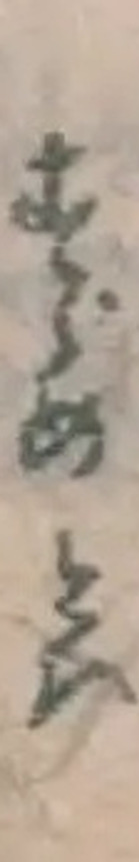すゞめとは
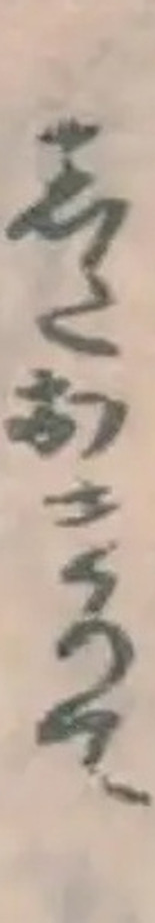したおきりて
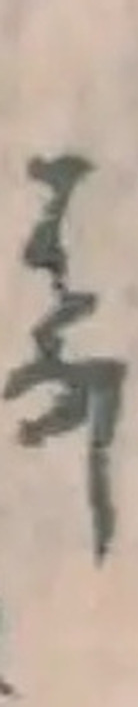はなし
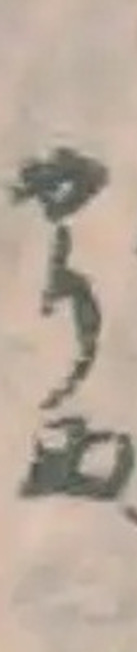やりぬ

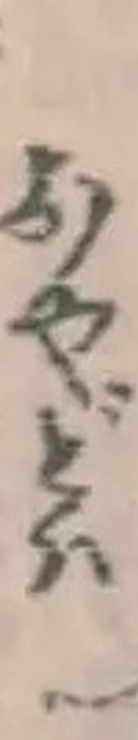おやどは
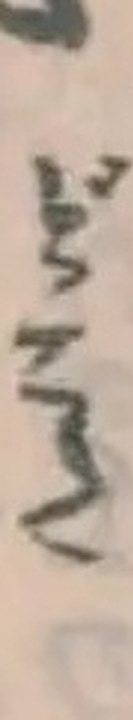どこた
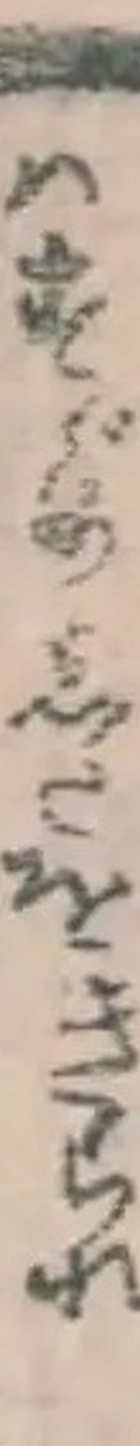はすゞめしたをきられ
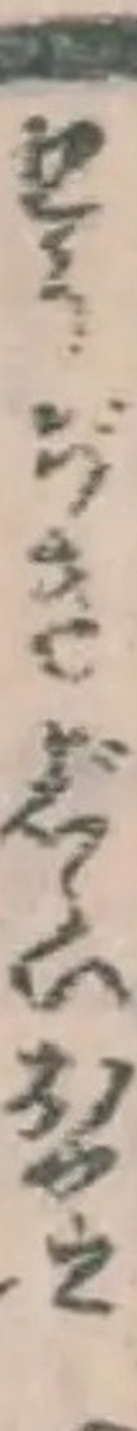せうぢきじゝいおやこ
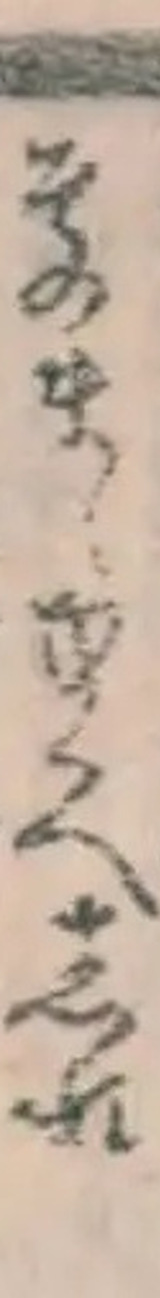そのまゝゆくへしれ
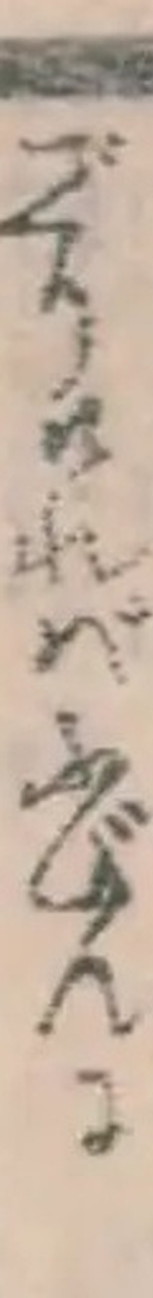ざりければふびんに
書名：舌切雀
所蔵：国立国会図書館 National Diet Library, JAPAN
